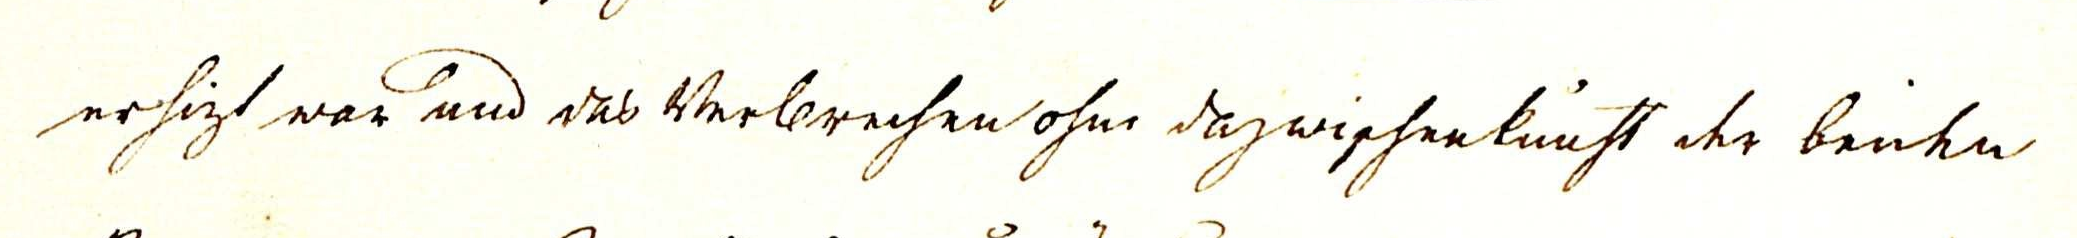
erhizt war und das Verbrechen ohne dazwischenkunft der beiden
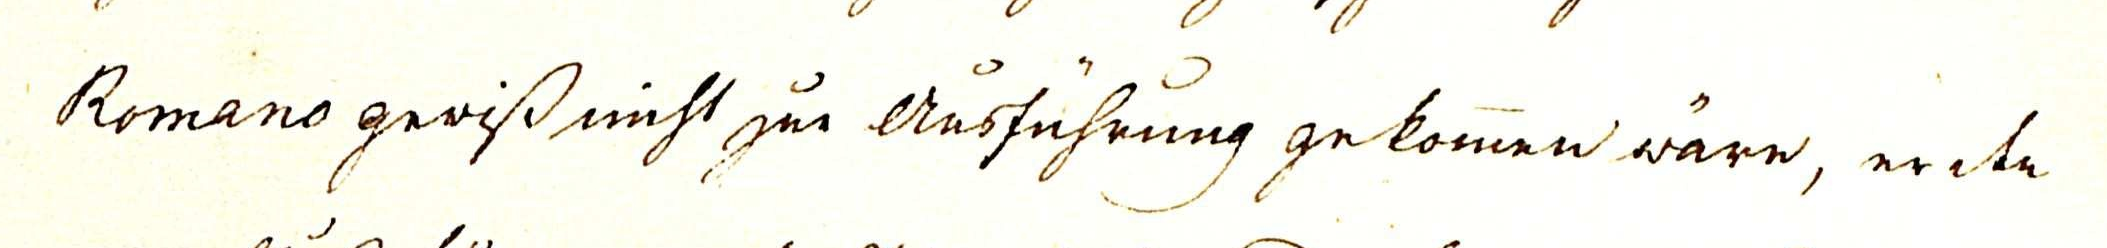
Romano gewiß nicht zur Ausführung gekommen wäre, er den
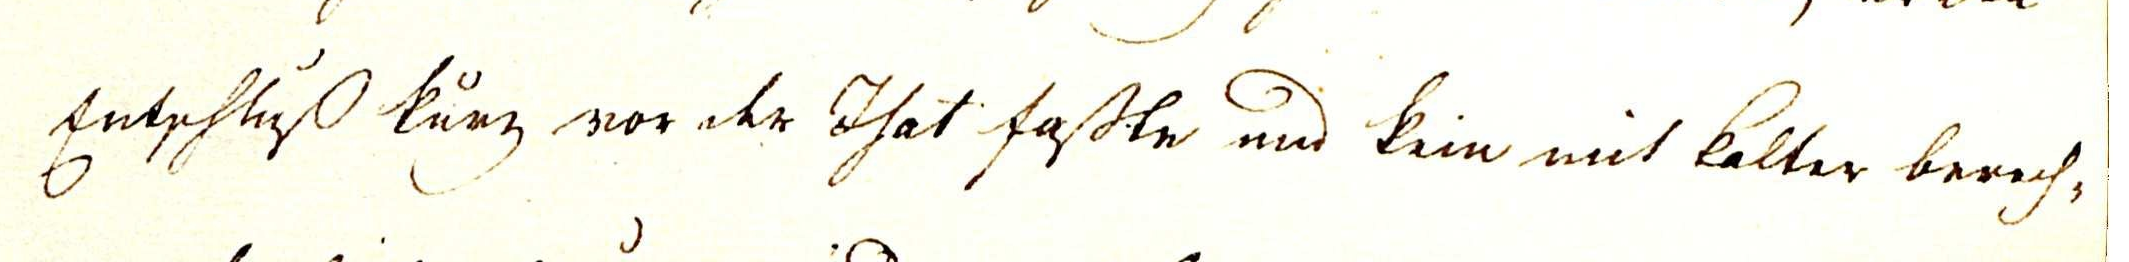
Entschluß kurz vor der That faßte und kein mit kalter berech¬
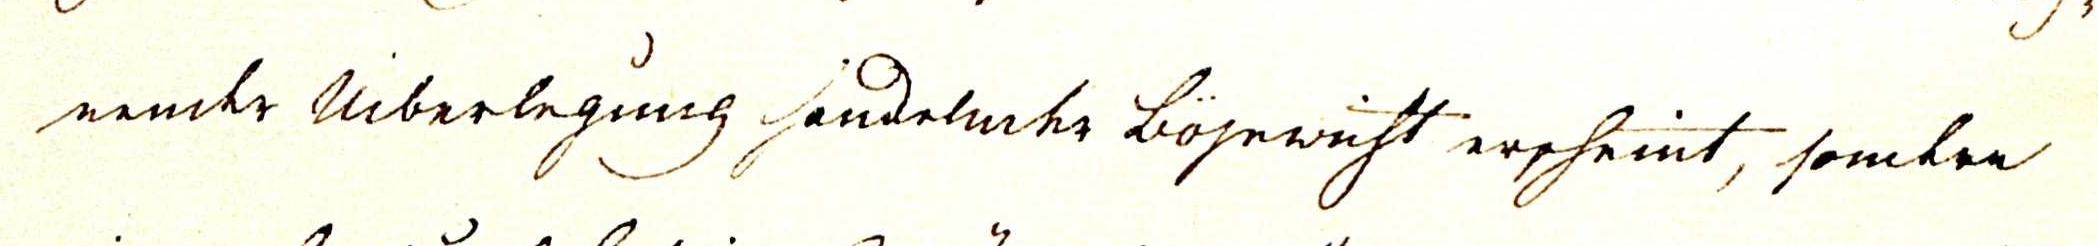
nender Uiberlegung handelnder Bösewicht erscheint, sondern
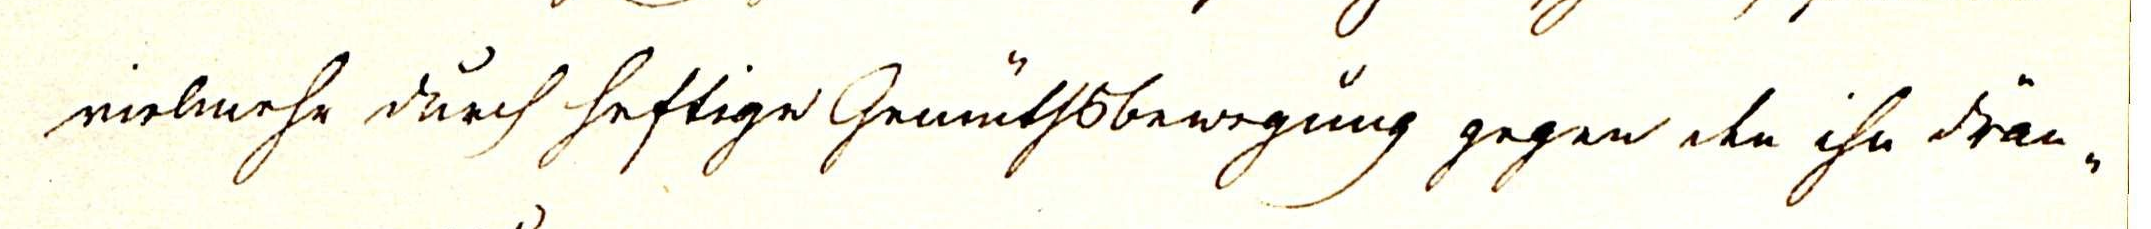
vielmehr durch heftige Gemütsbewegung gegen den ihn drän¬
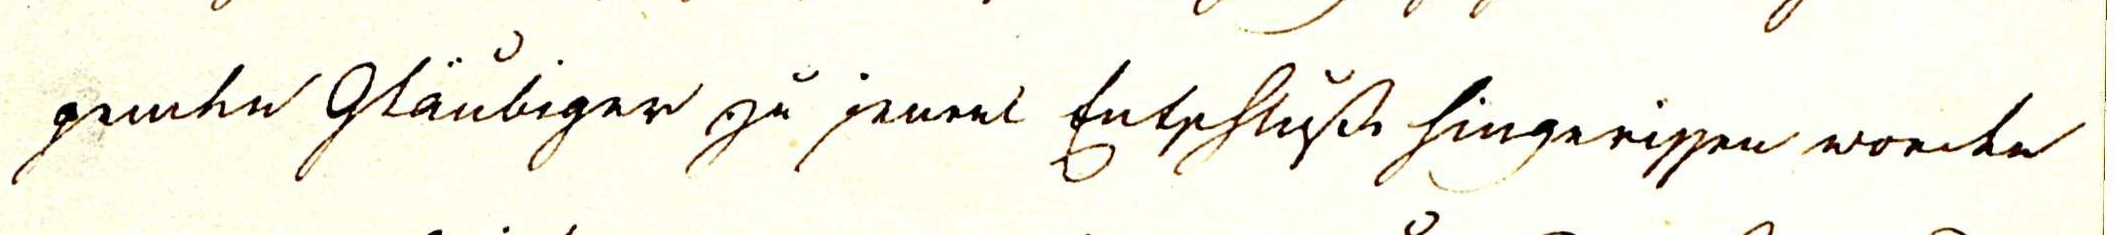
genden Gläubiger zu jenes Entschluße hingerissen worden
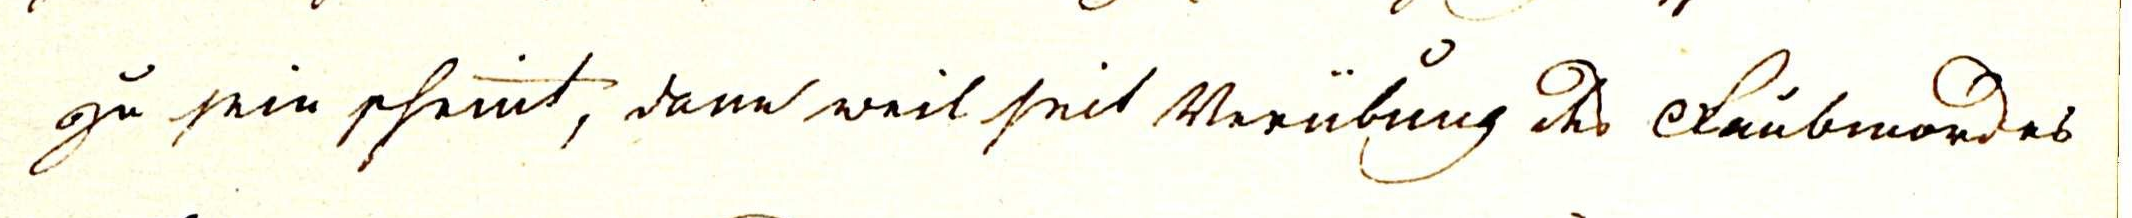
zu sein scheint, dann weil seit Verübung des Raubmordes
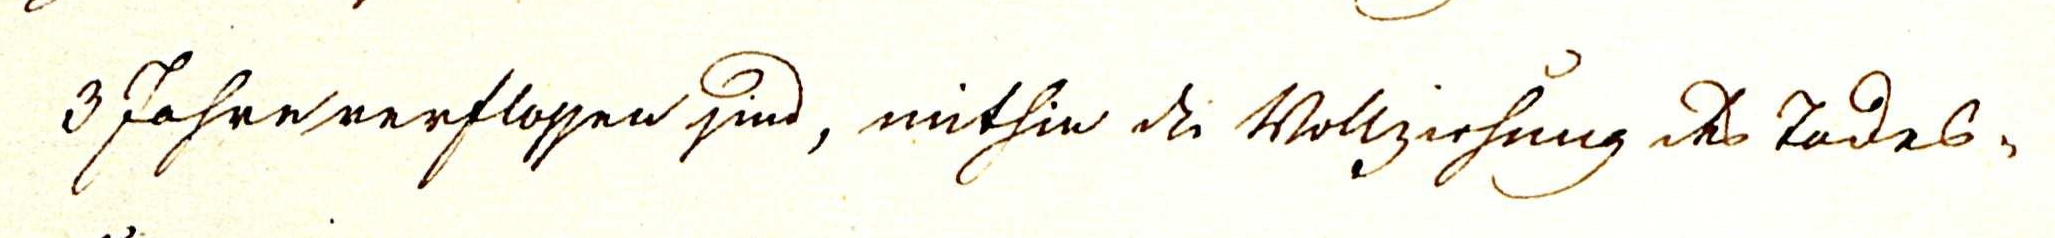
3 Jahre verflossen sind, mithin die Vollziehung des Todes¬
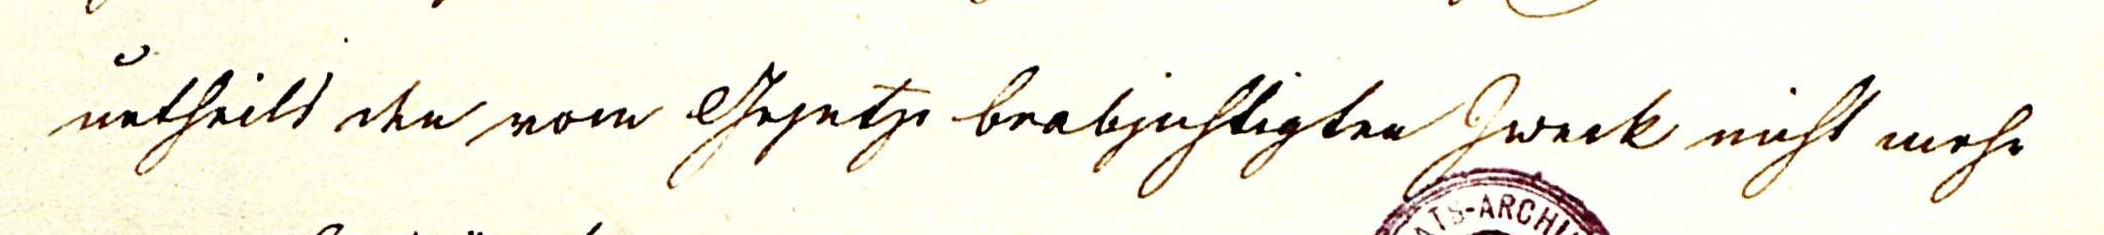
urtheils den vom Gesetze beabsichtigten Zweck nicht mehr
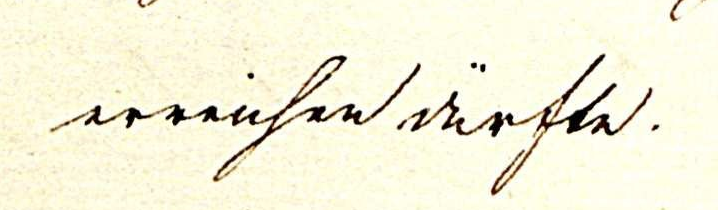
erreichen dürfte.
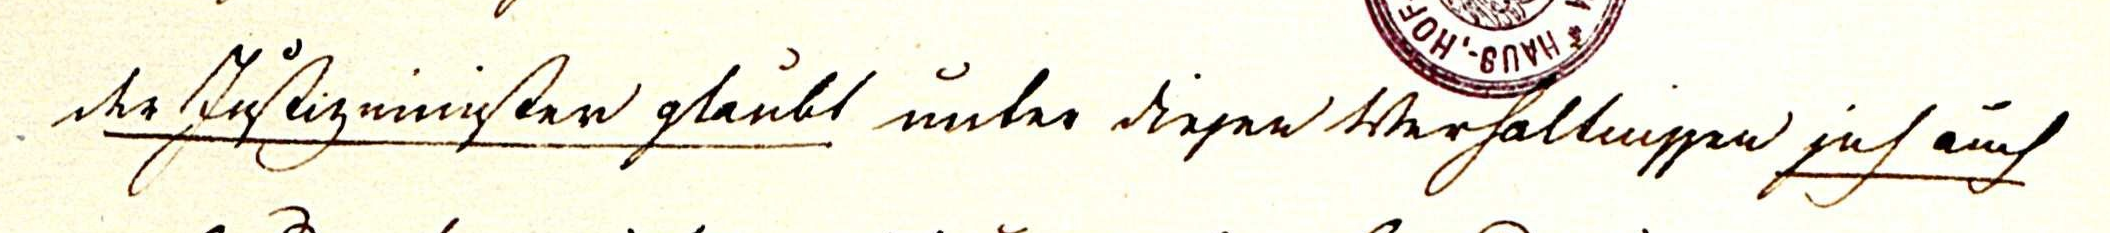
Der Justizminister glaubt unter diesen Verhaltnissen sich auch
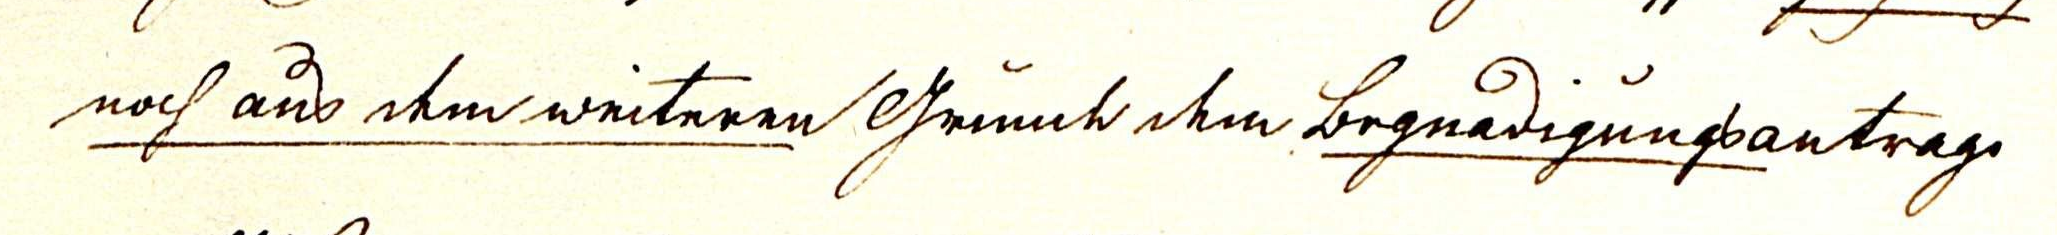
noch aus dem weiteren Grunde dem Begnadigungsantrag
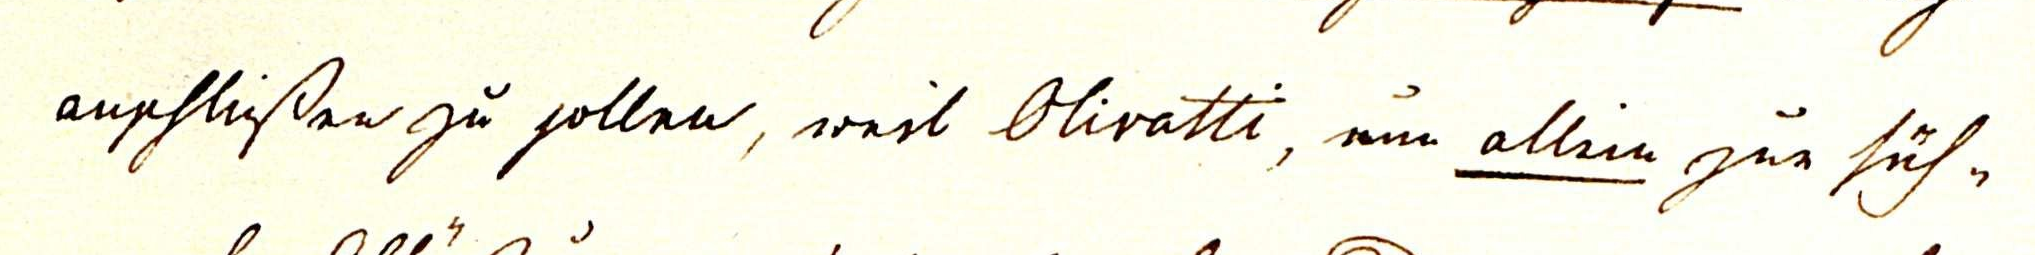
anschlißen zu wollen, weil Olivatti, um allein zur süh¬
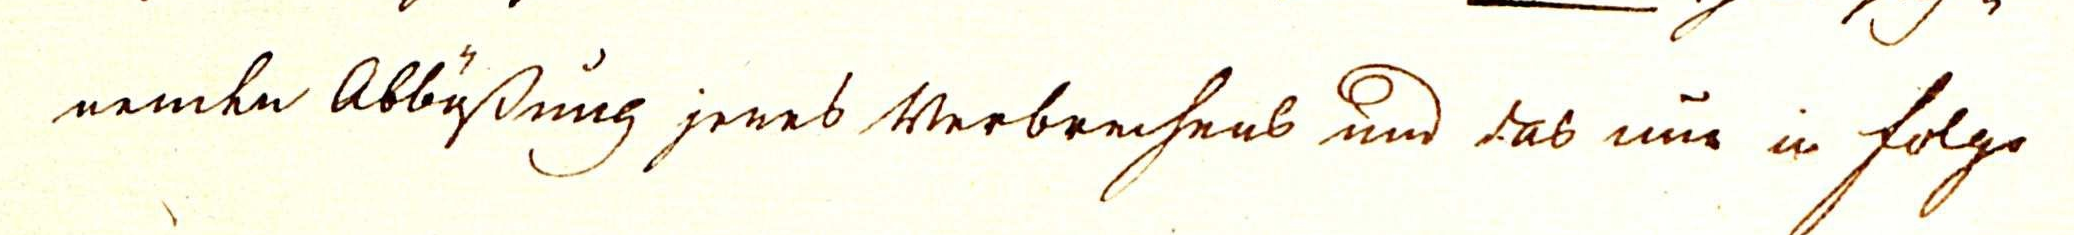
nenden Abbüßung jenes Verbrechens und das nur in Folge
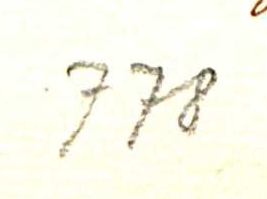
778
